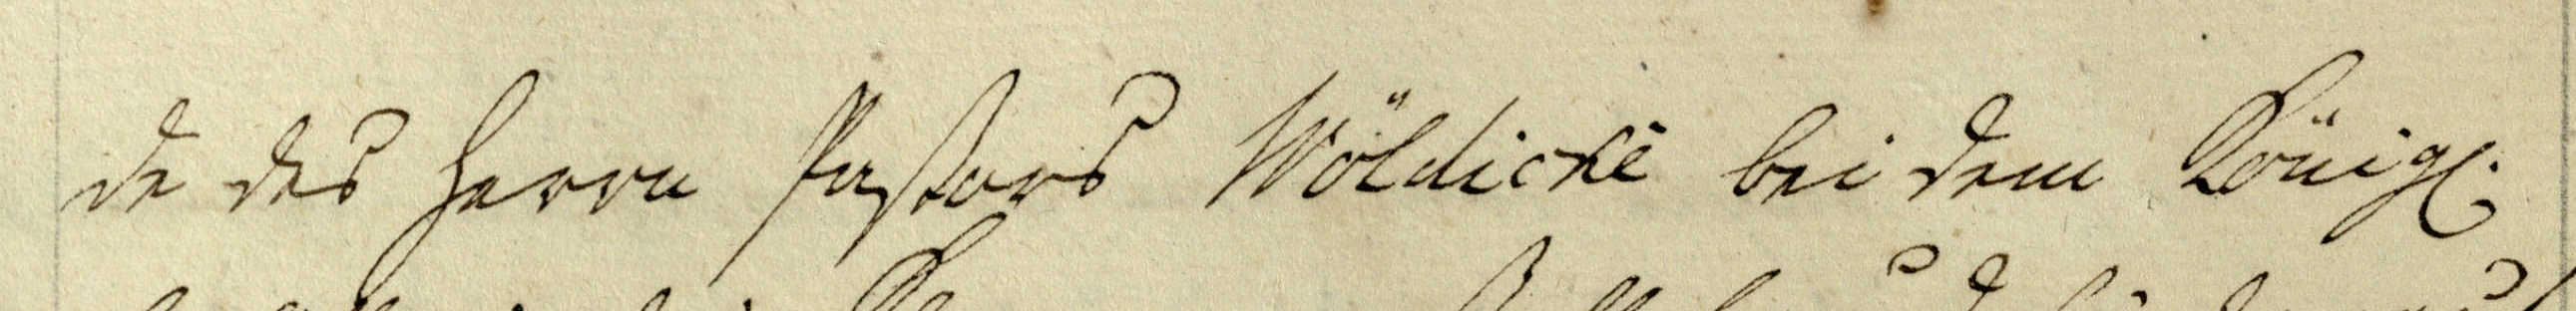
de der Herrn Pastors Wöldicke bei dem Königl.
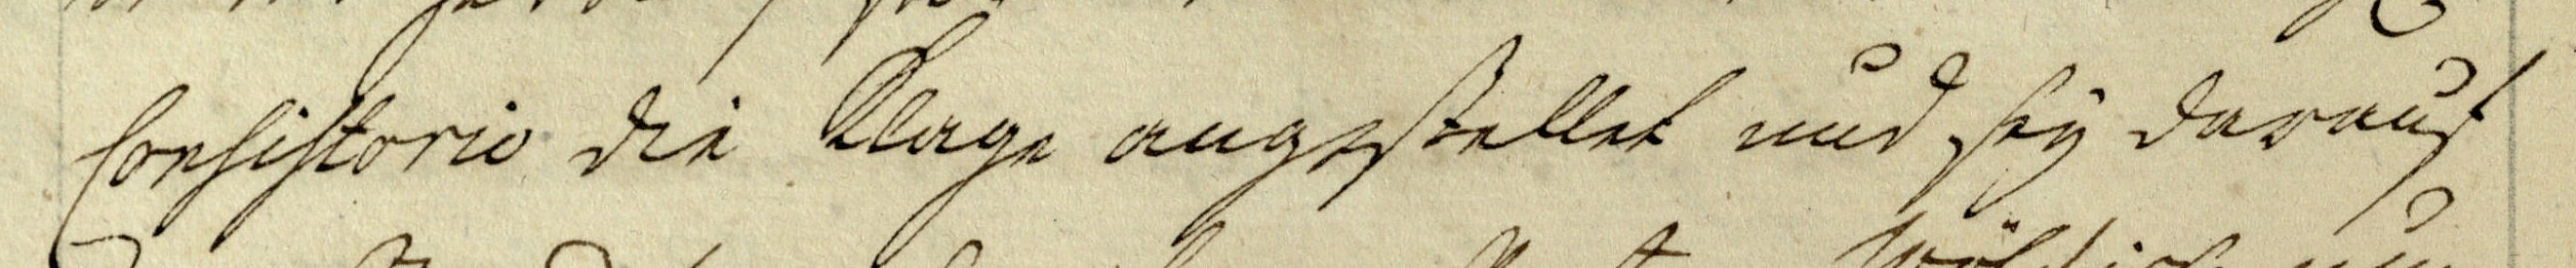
Consistorio die Klage angestellet und seÿ darauf
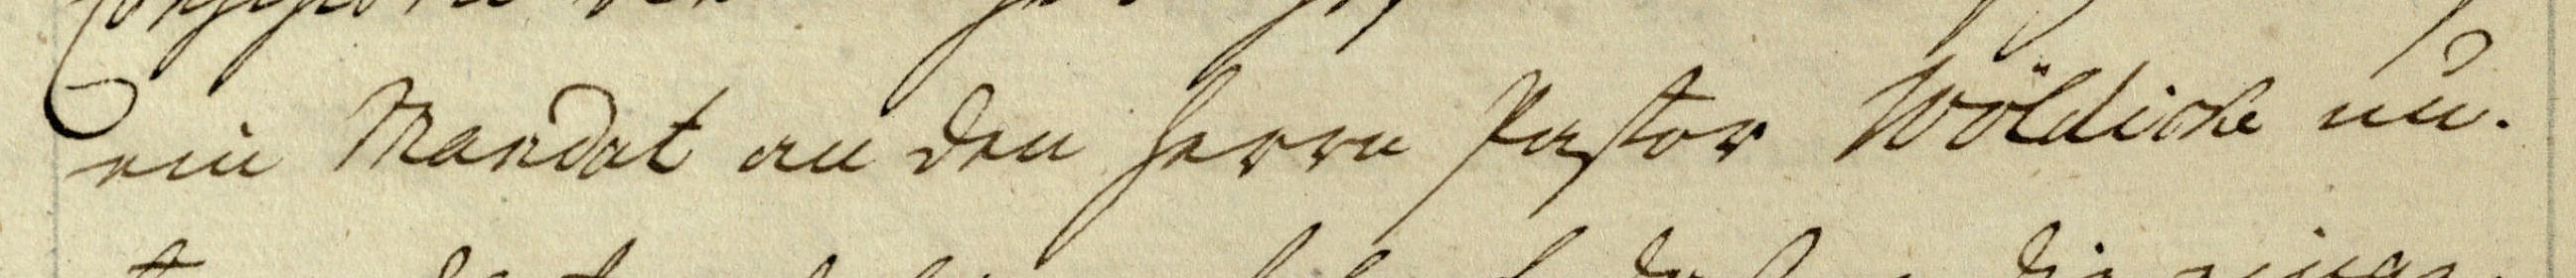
ein Mandat an den Herrn Pastor Wöldicke un¬
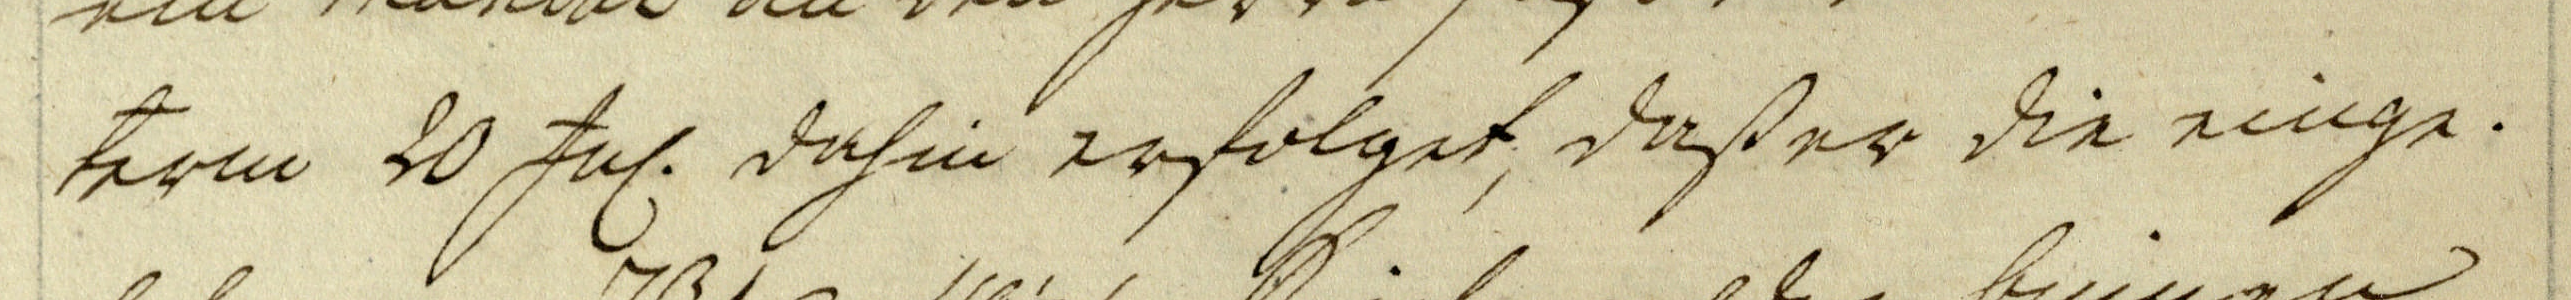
term 20 Jul., dahin erfolget, daß er die einge¬
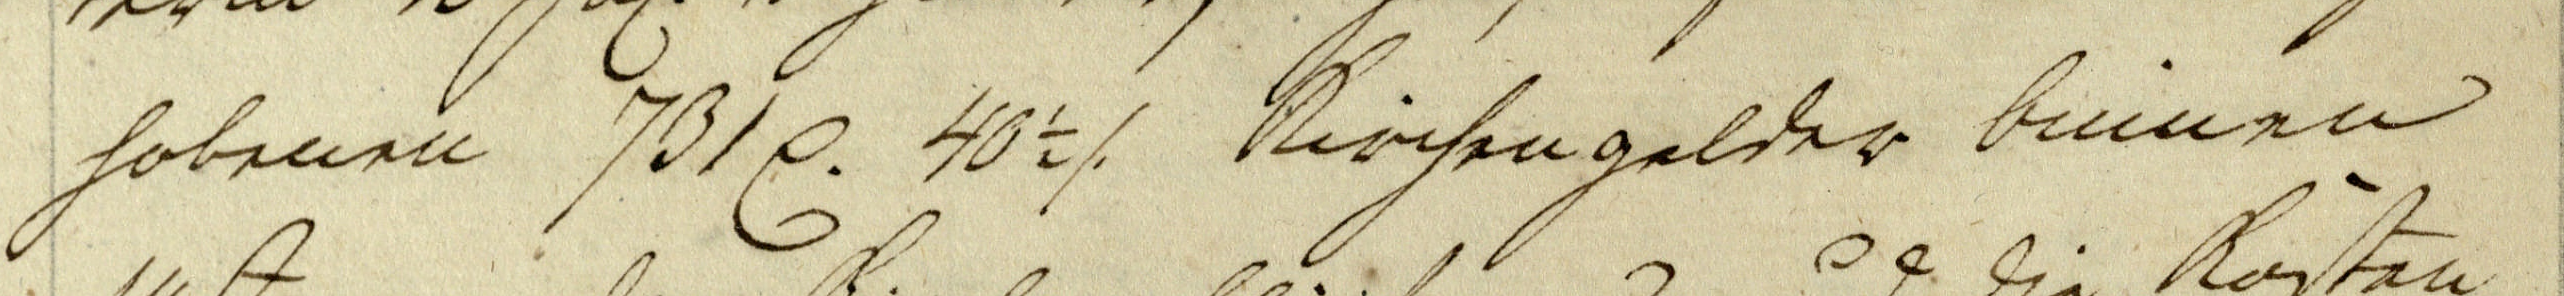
hobenen 731 l. 40½ s. Kirchengelder binnen
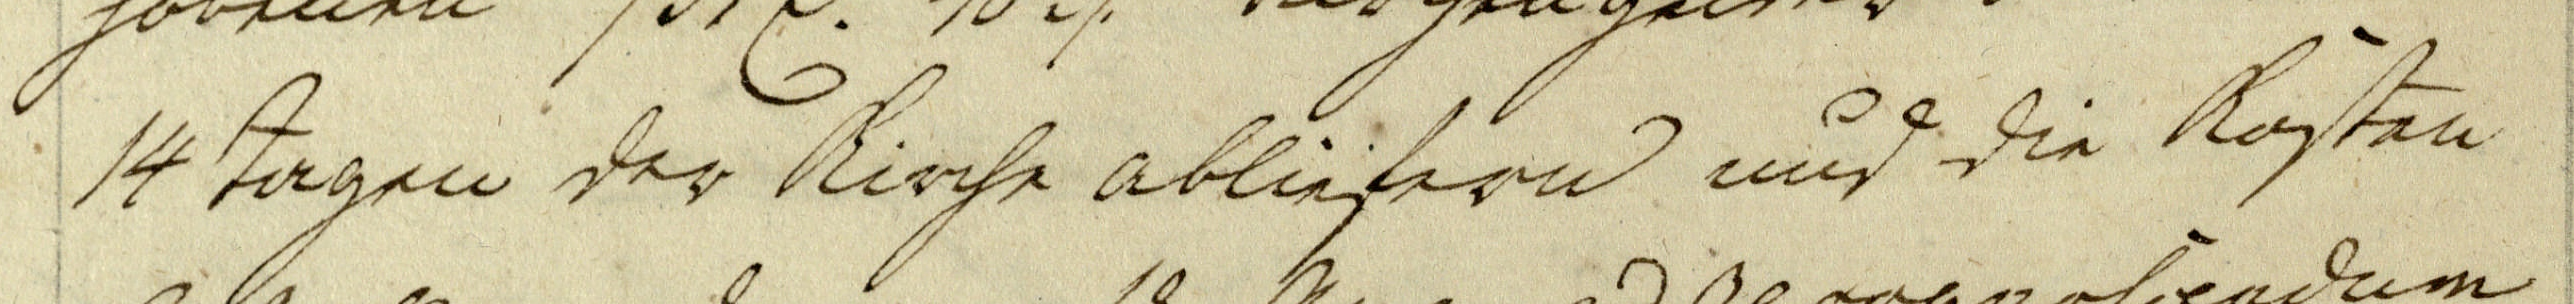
14 Tagen der Kirche abliefern und die Kosten
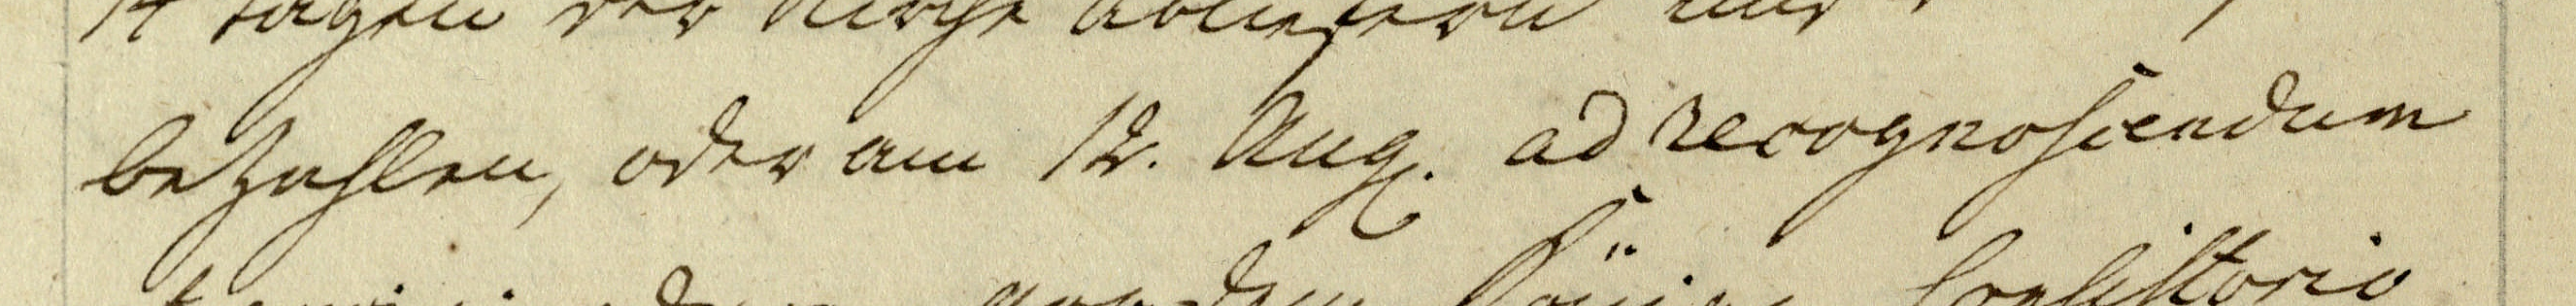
bezahlen, oder am 12. Aug. ad recognoscendum
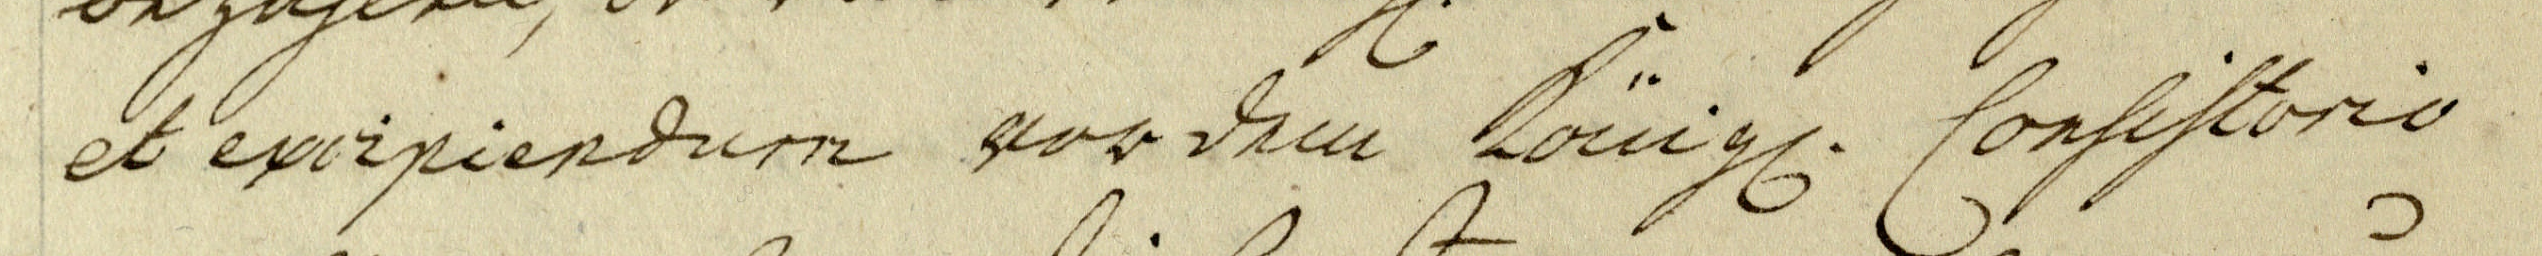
et excipiendum vor dem Königl. Consistorio
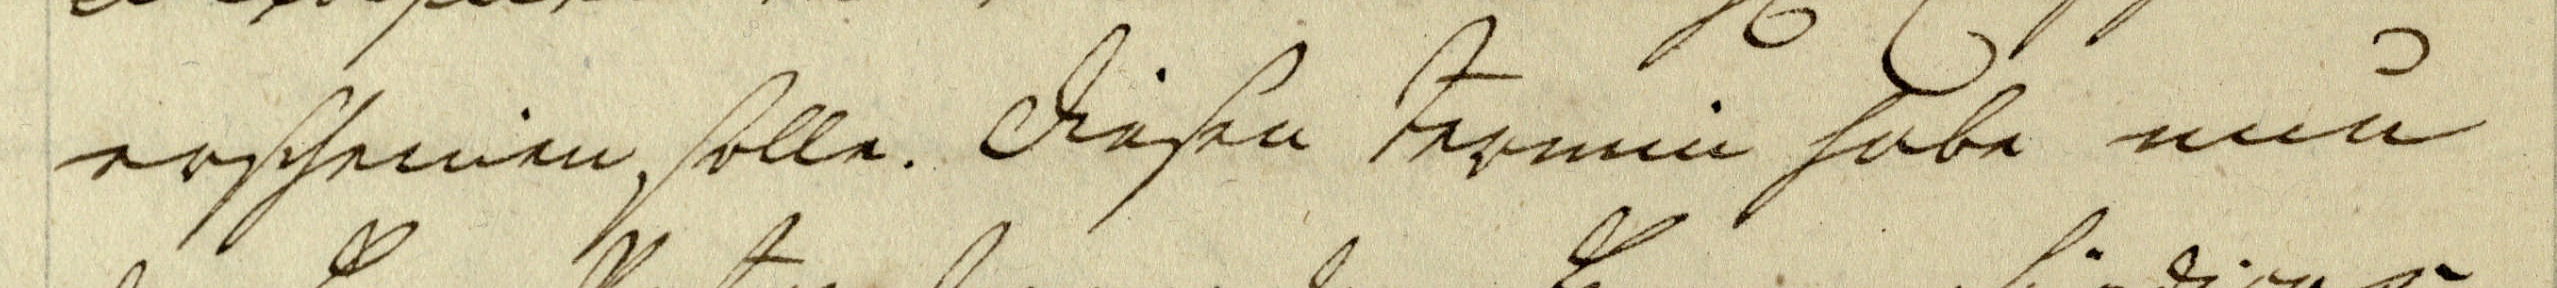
erscheinen solle. Diesen Termin habe nun
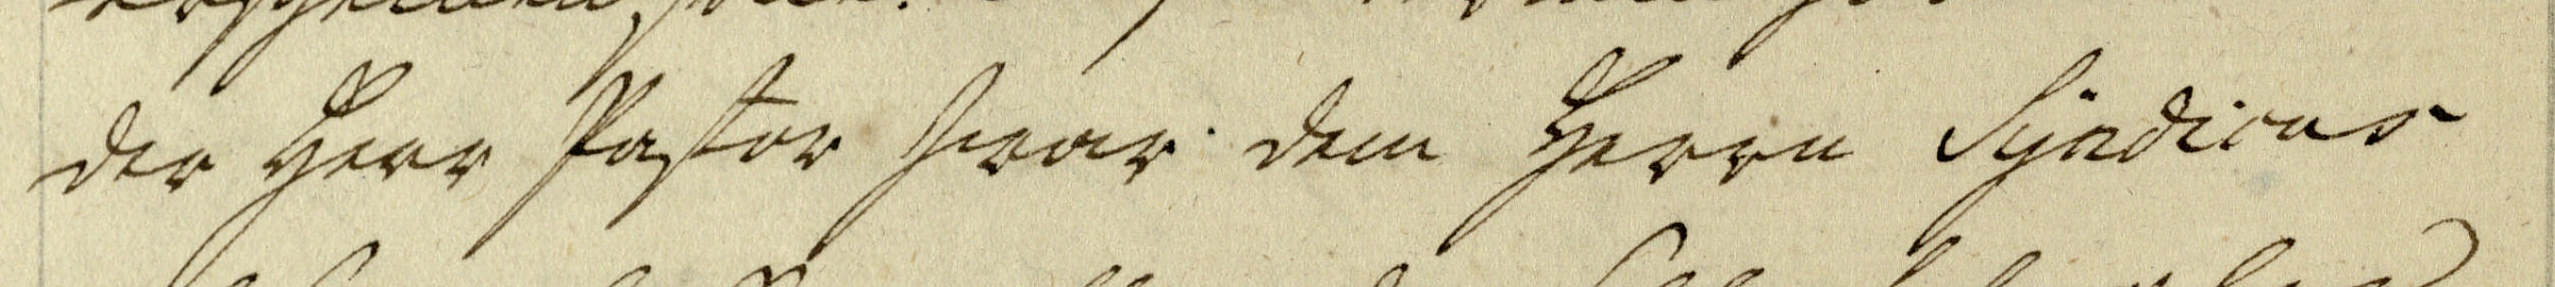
der Herr Pastor zwar dem Herrn Sÿndicus
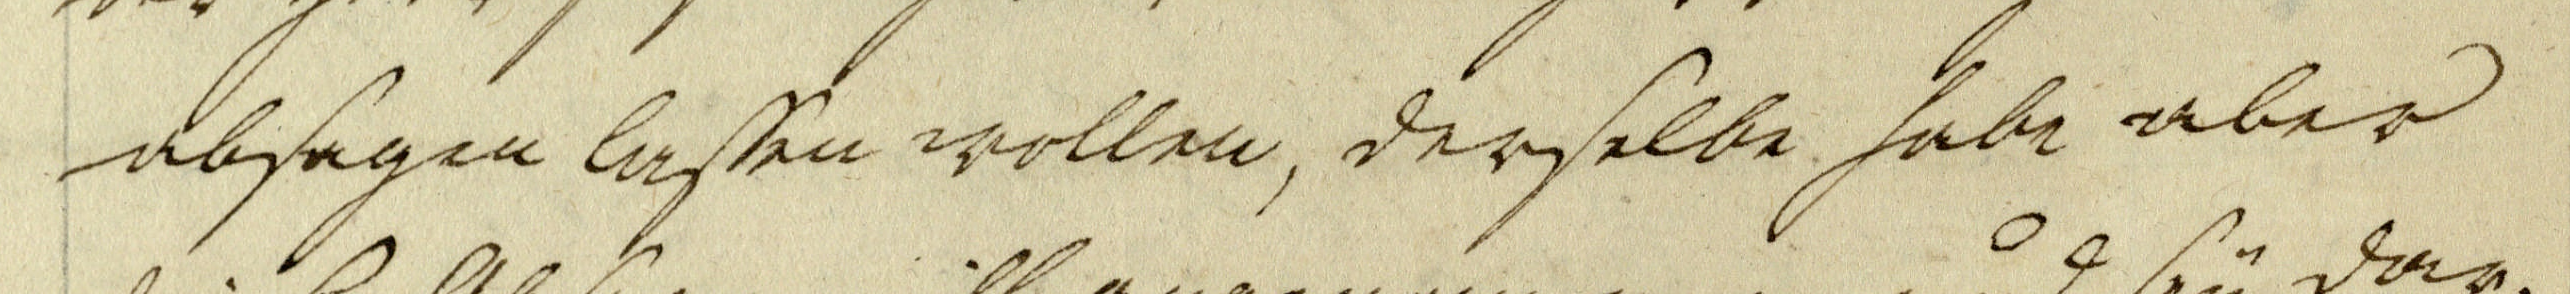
absagen lassen wollen, derselbe habe aber
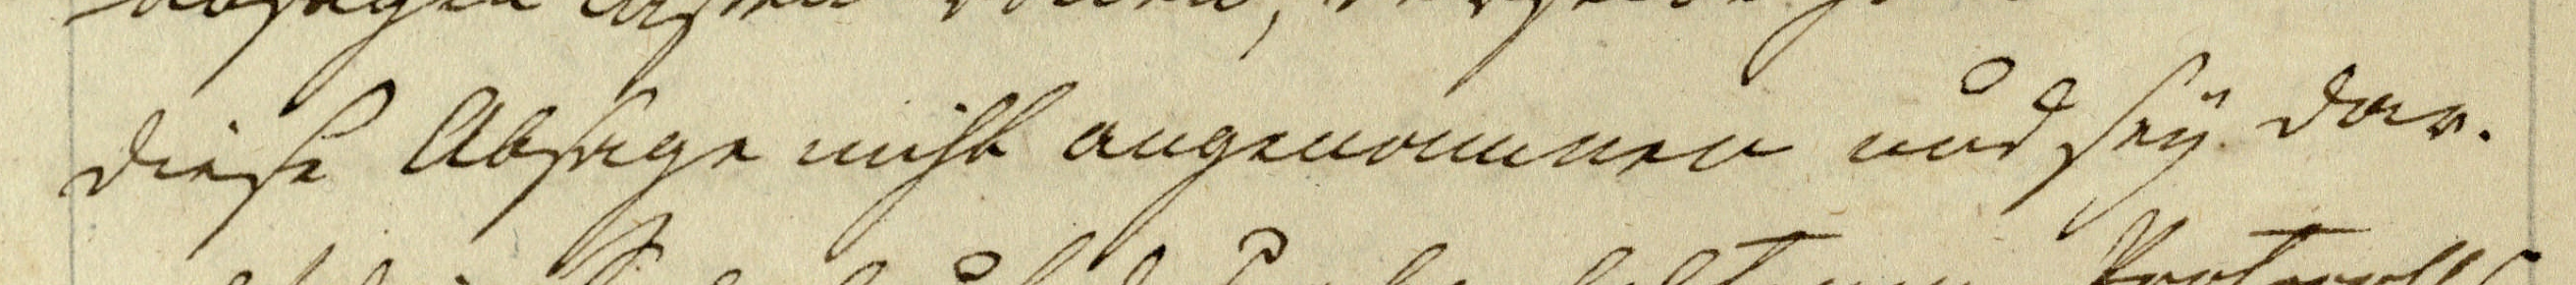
diese Absage nicht angenommen und seÿ dar¬
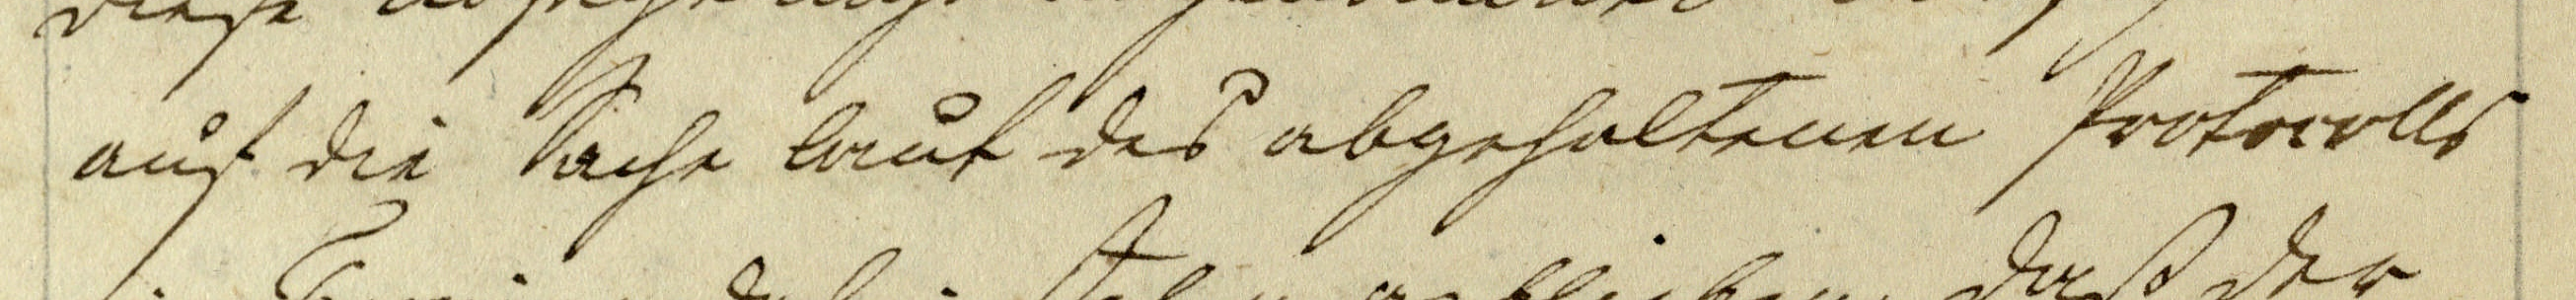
auf die Sache laut des abgehaltenen Protocolls
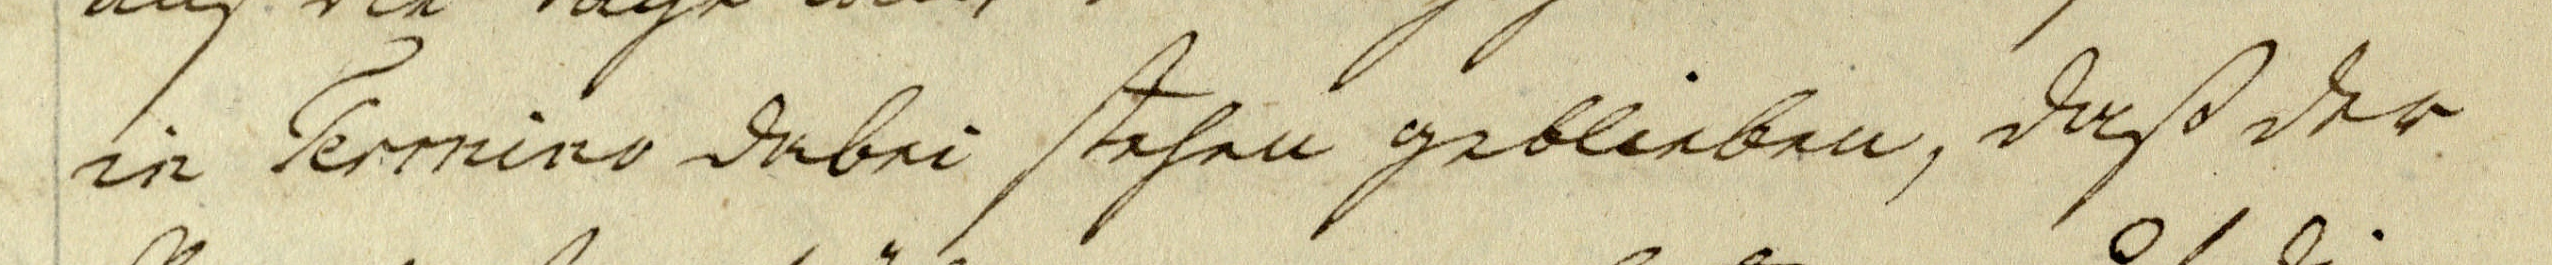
in Termino dabei stehen geblieben, daß der
